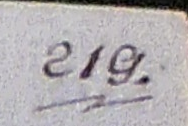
219.
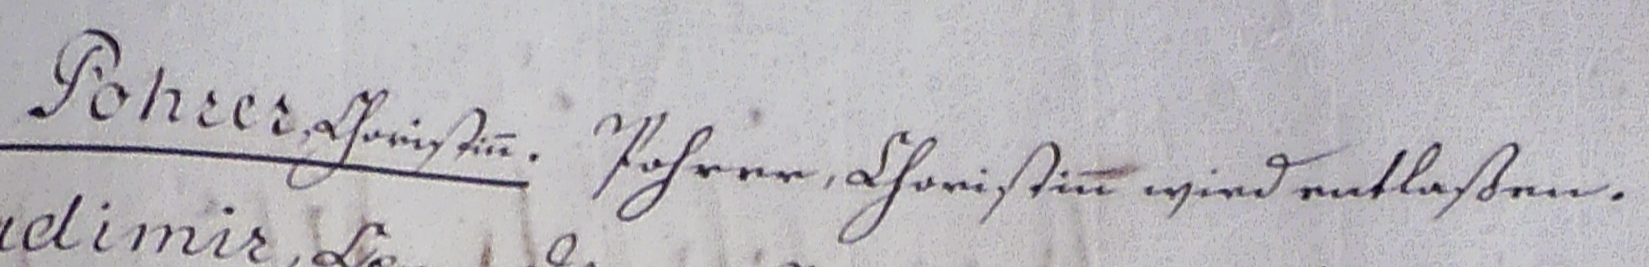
Pohrer, Choristin̅. Pohrer, Choristin̅ wird entlaßen.
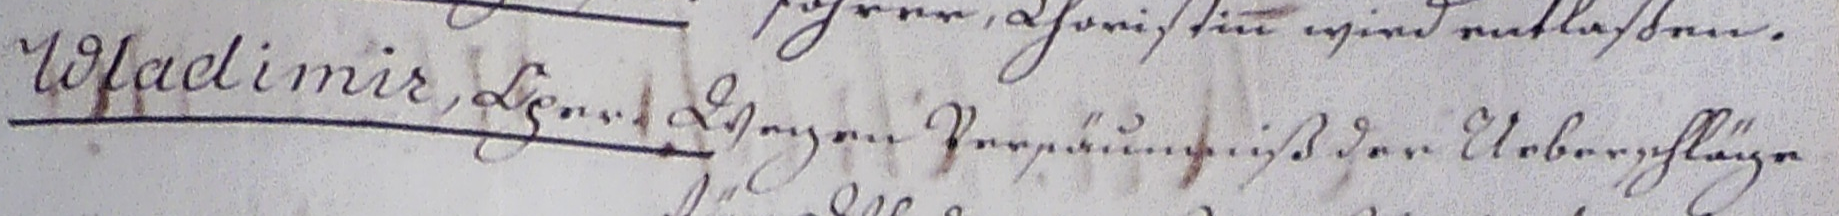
Wladimir, Oper. Wegen Versäumniß der Ueberschläge
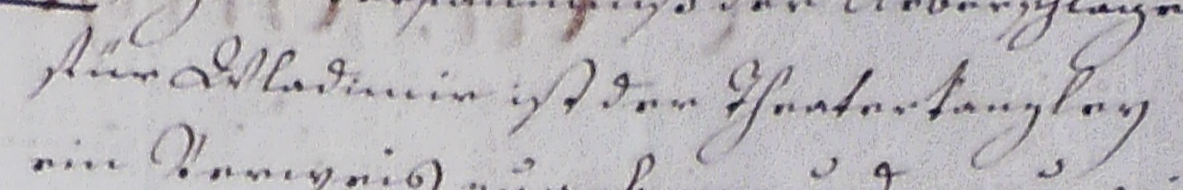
für Wladimir ist der Theaterkanzley
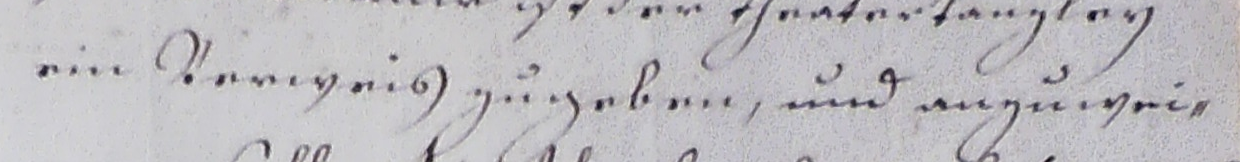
ein Verweis zu geben, und anzuwei¬
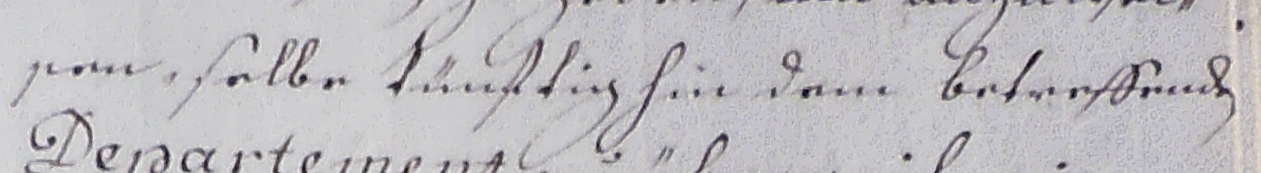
sen, selbe künftig hin dem betreffenden
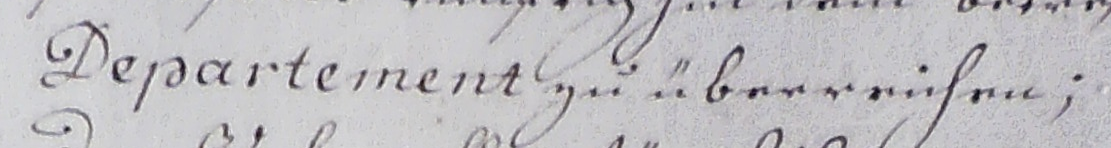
Departement zu überreichen;
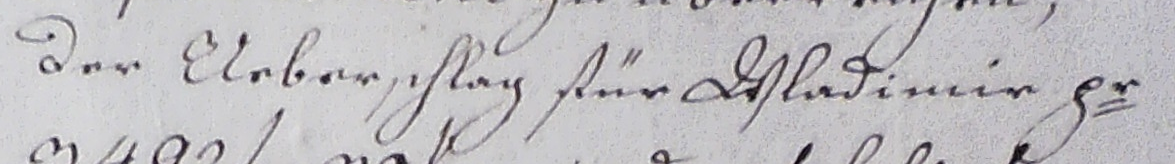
der Ueberschlag für Wladimir pr͇
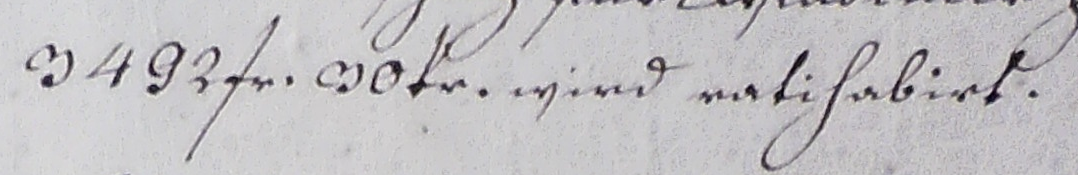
3492fr. 30kr. wird ratihabirt.
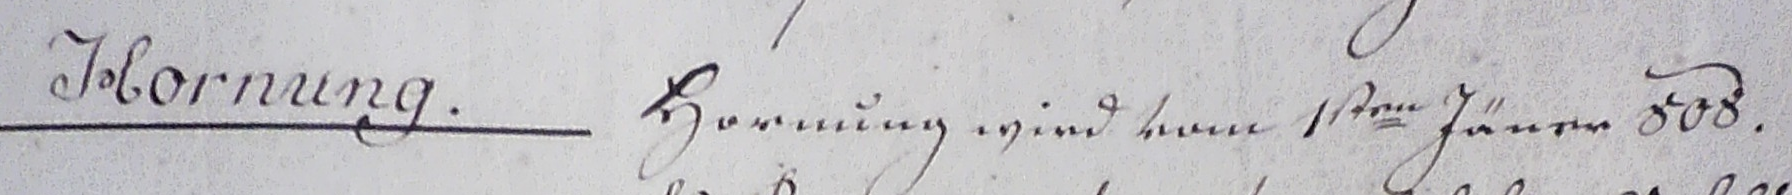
Hornung. Hornung wird vom 1ste͇n Jäner 8̅0̅8̅.
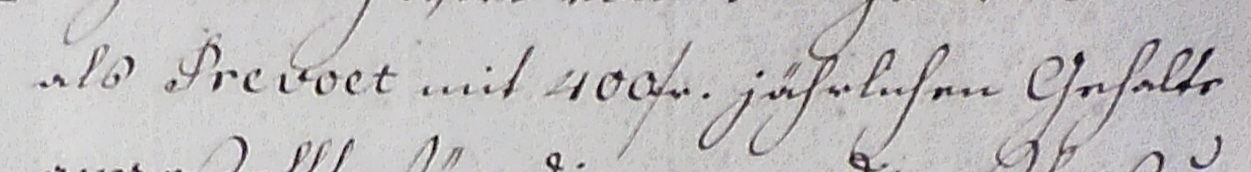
als Prevoet mit 400fr. jährlichen Gehalte
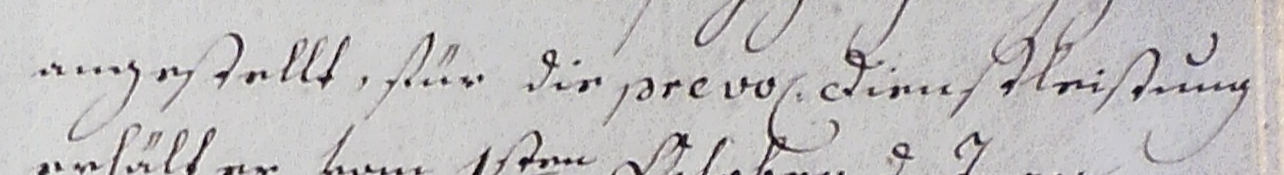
angestellt, für die prevoe: Dienstleistung
